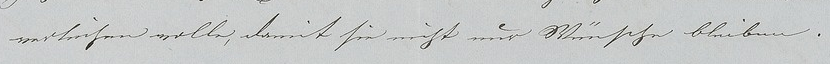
verleihen wolle, damit sie nicht nur Wünsche bleiben.
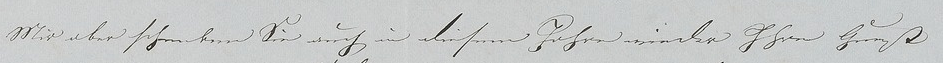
Mir aber schenken Sie auch in diesem Jahre wieder Ihre Gunst
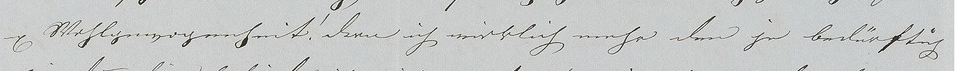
& Wohlgewogenheit! dern ich wirklich mehr den je bedürftig
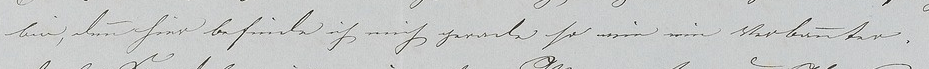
bin, denn hier befinde ich mich gerade so wie ein Verbannter.
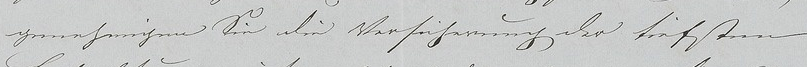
genehmigen Sie die Versicherung der tiefsten
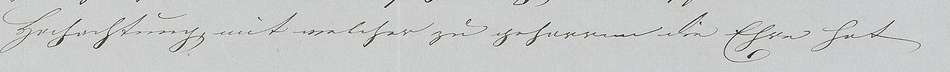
Hochachtung, mit welcher zu geharren die Ehre hat
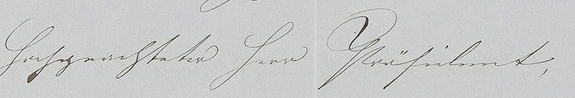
Hochgeachteter Herr Präsident,
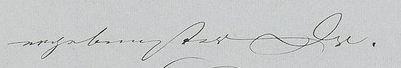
ergebenster Dr.
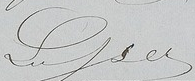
Lusser
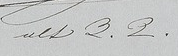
alt R.R.
